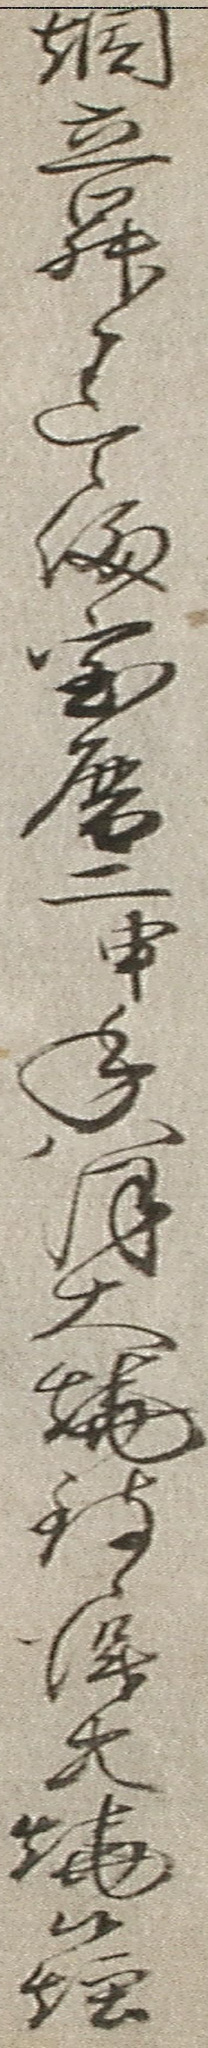烟立昇候迄之儀宝暦二申年八月大焼致候得共焼候煙
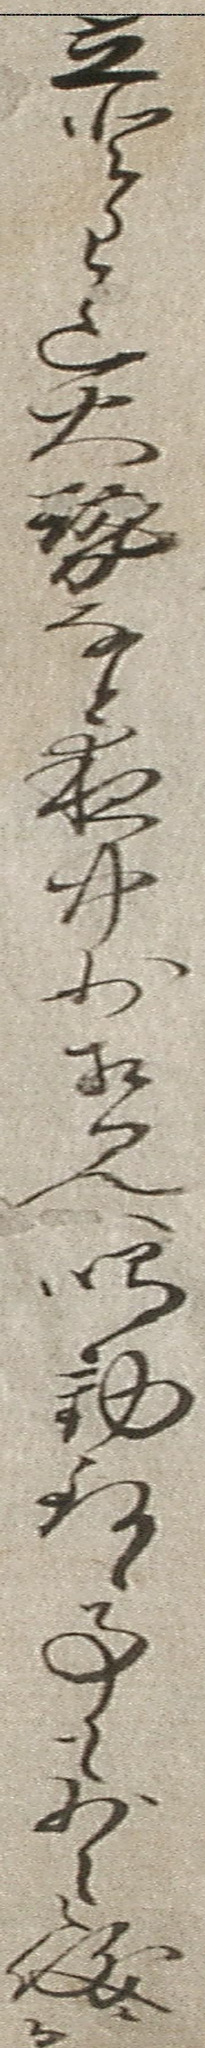立登り候迄火勢なと夜中少相見へ鳴動致候事も少し之儀に而
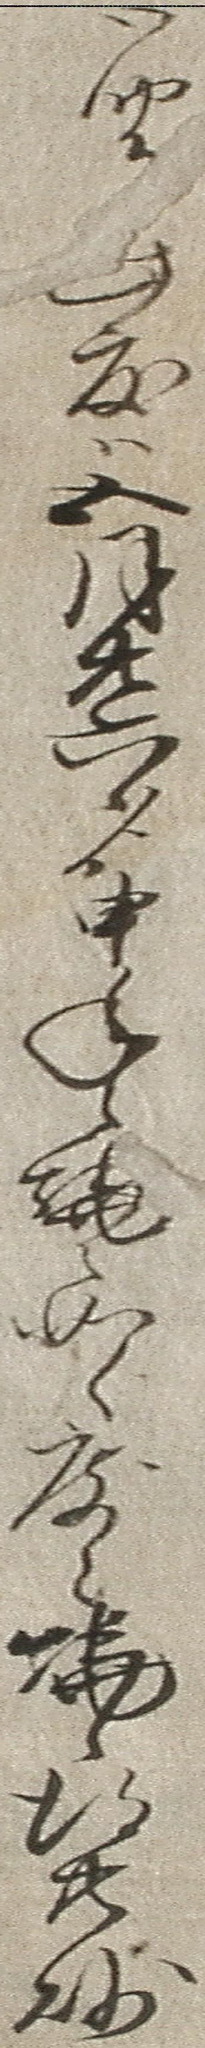御座候此度は五月廿六日ゟ申年之焼之如く度々焼候得共砂
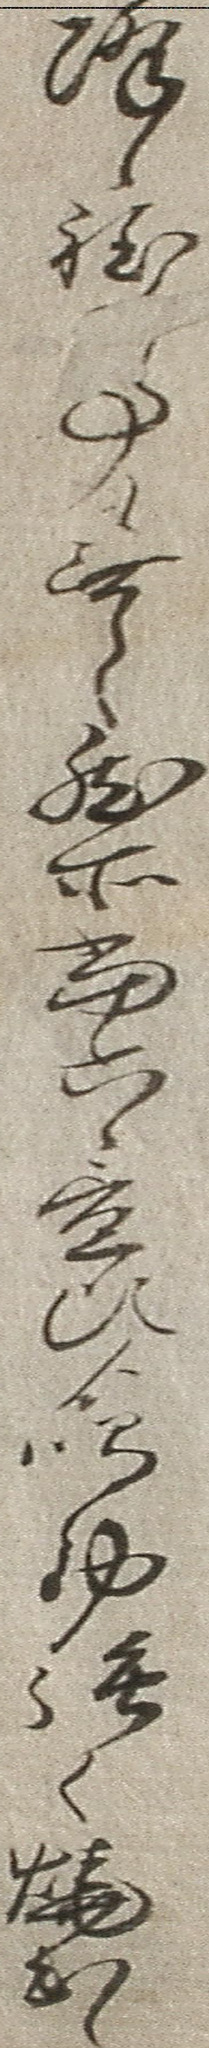降候程之事之無之然所当六日昼頃ゟ鳴動強く焼出し
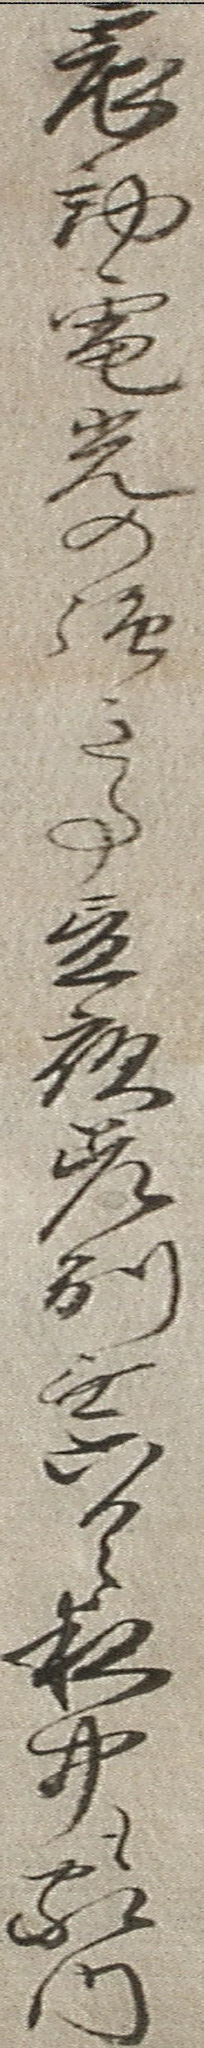震動電光の強き事昼夜差別無六日之夜中も家内
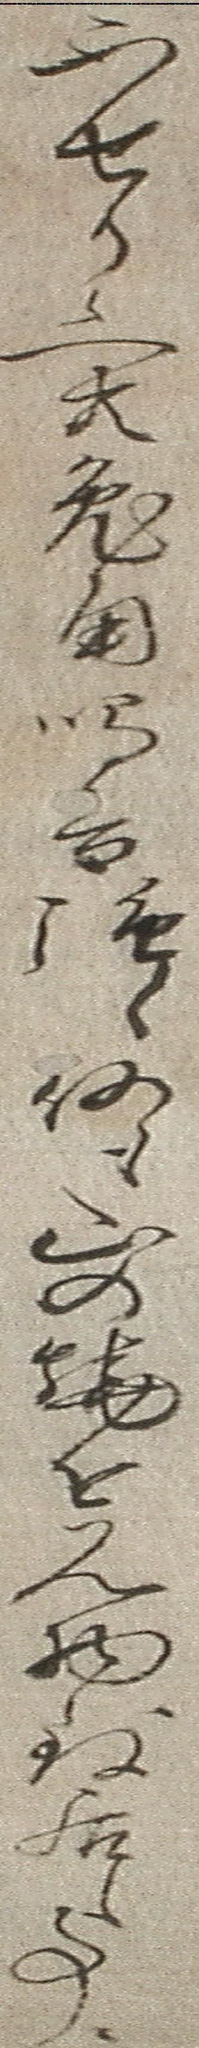ふせり候へ共兎角鳴音強く何も山の焼を見物致居候事に
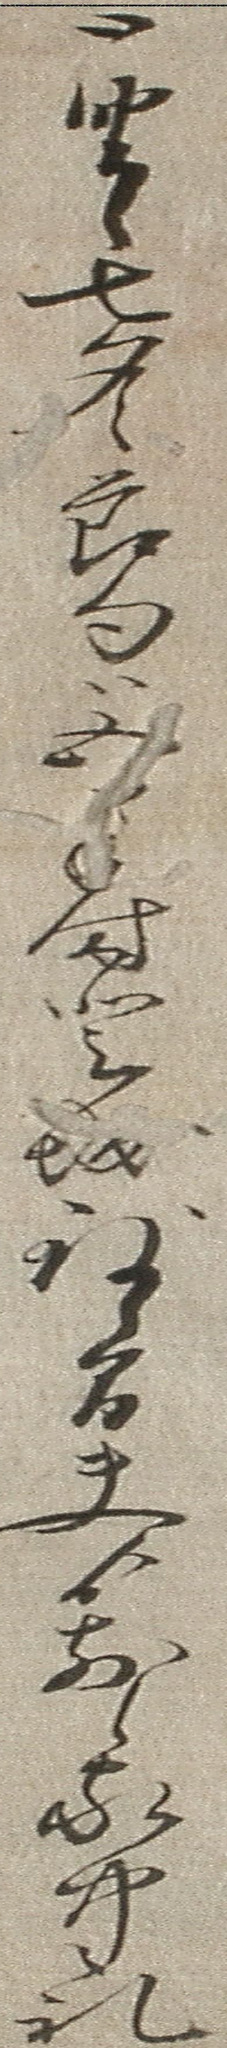御座候七夕之節句は五ツ半時登城致候間夫ゟ前之家中之礼
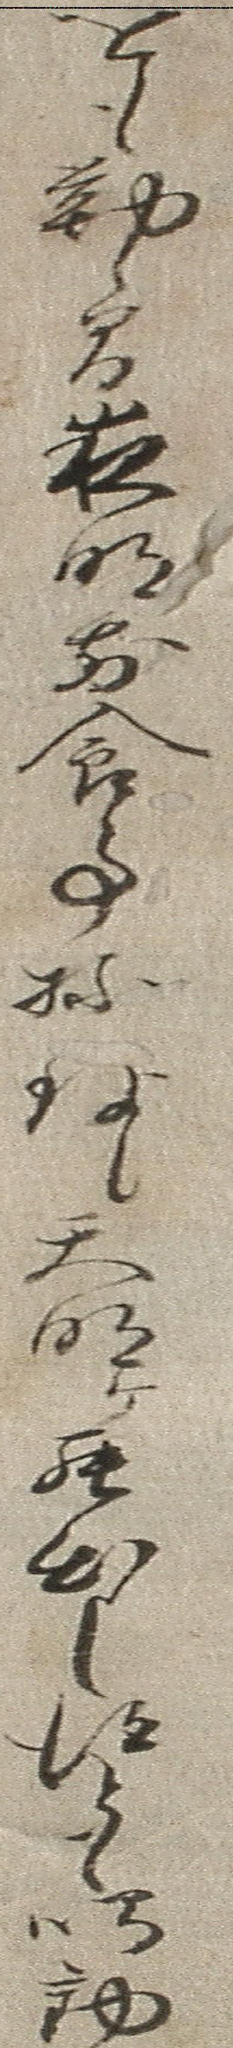をも勤候間夜明前食事抔致し天明ヶ罷出申候得とも鳴動
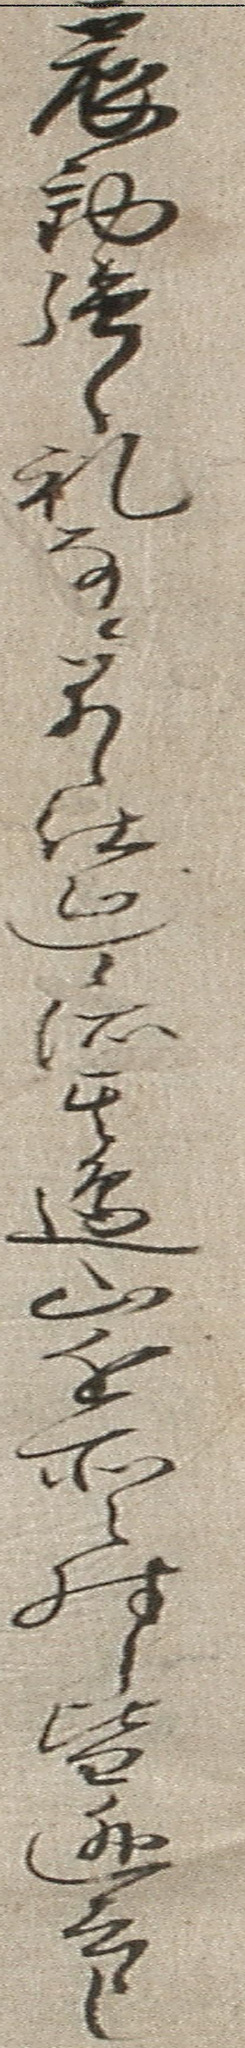震動強く礼などは早々仕廻候所其辺山近所之村々皆逃去りし
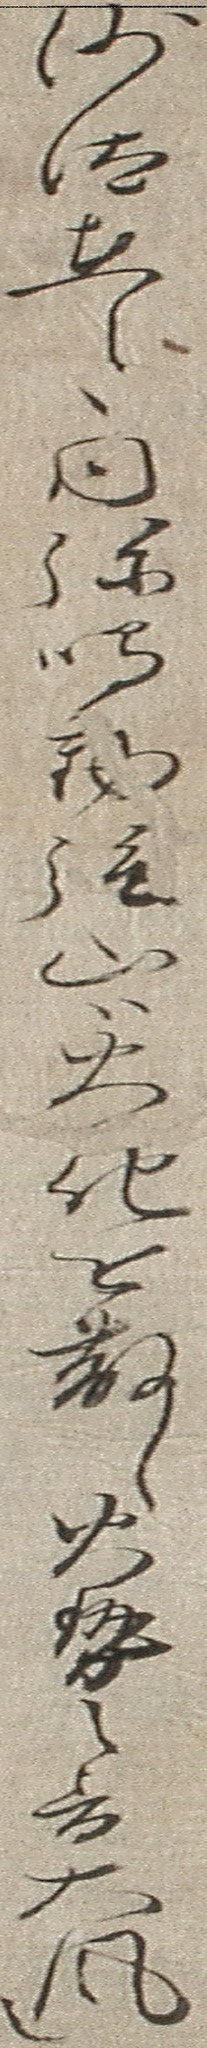沙汰在之候同弥鳴動強く山は火花を散し火勢之音大風之
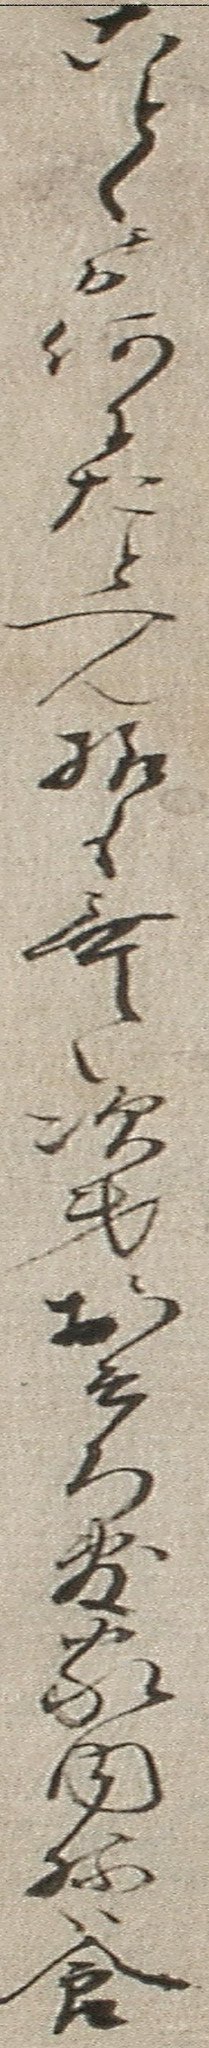ことくに而何にたとへん様も無之之次第におそろ敷家内抔は食
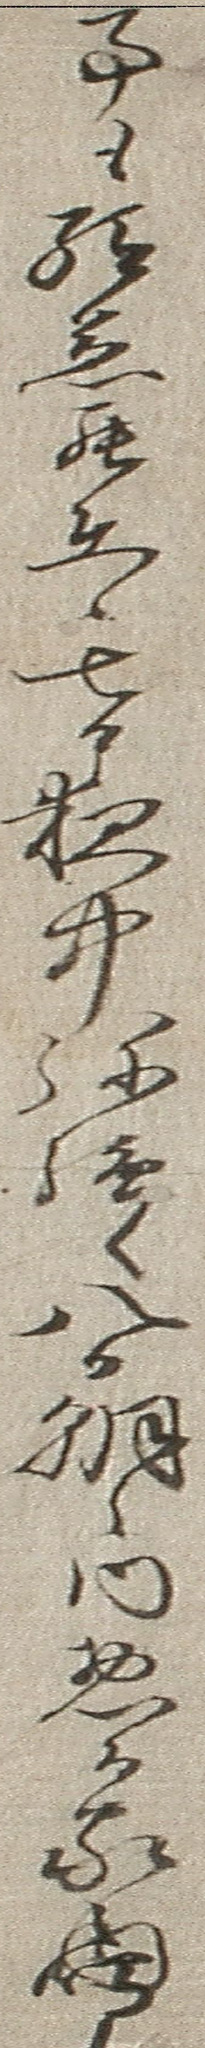事も駈着？罷在候七日夜中弥強く八日朝之内惣而家内之
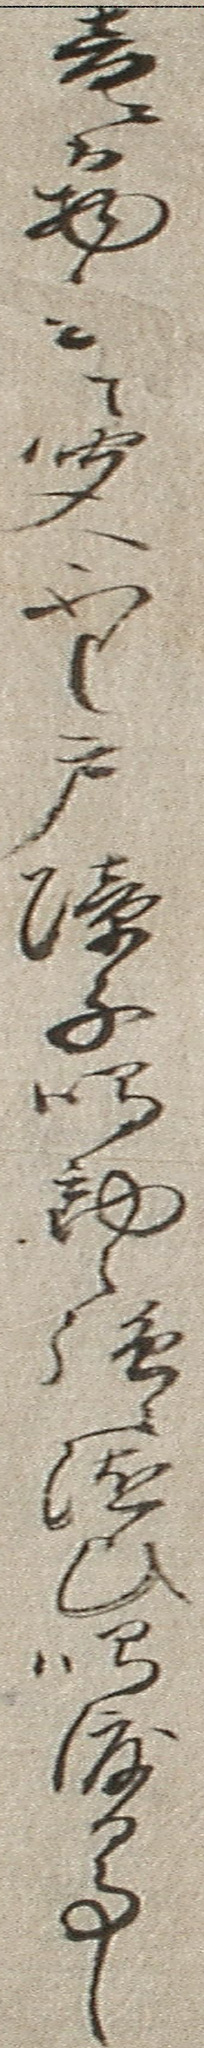音に而物音聞へ不申候戸障子鳴動之強に随ひ鳴渡候事
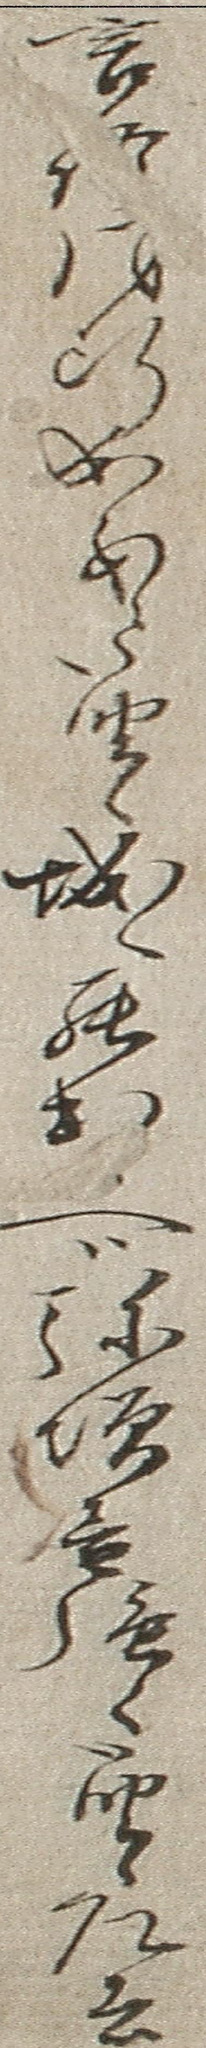言語同断成義に御座候城へ罷出候へは弥増音強く御座候乍去
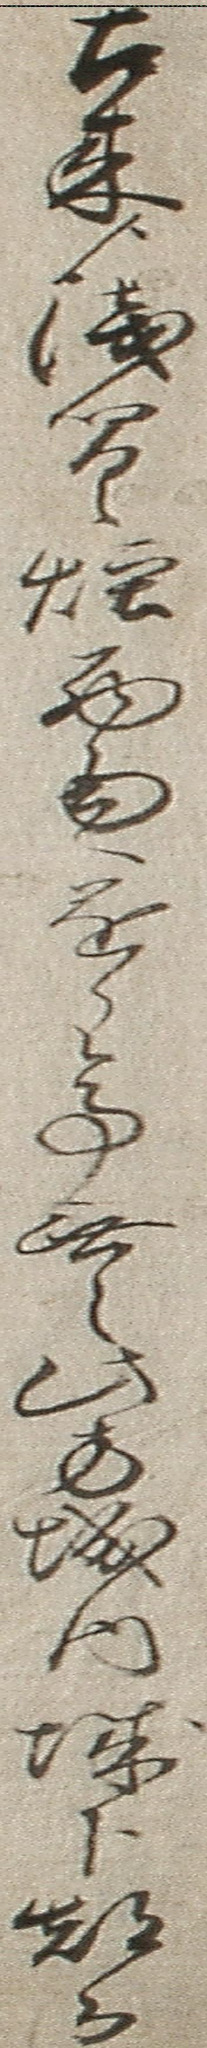古来ゟ浅間之煙西南へ懸り候事無之此方城内城下都而
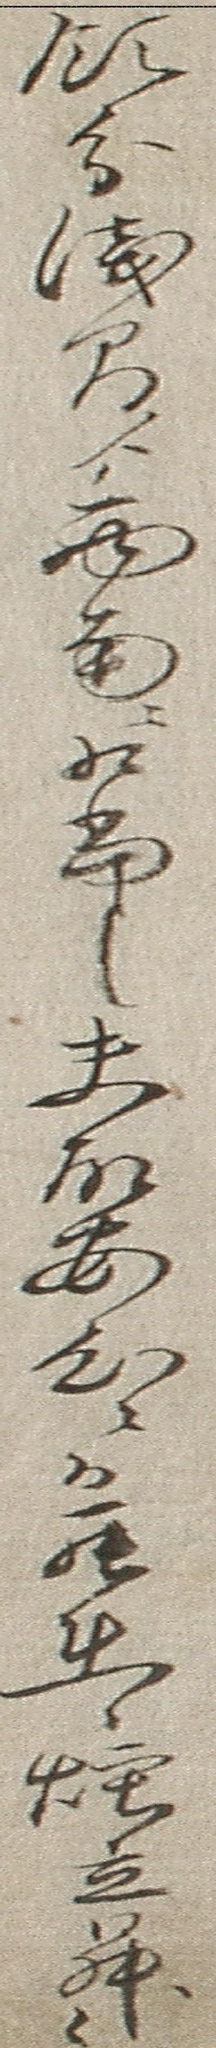領分浅間ゟ西南に相当申候夫故安心に而罷在候煙立昇候
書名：太平秘録抜書　浅間山燒及普賢山崩
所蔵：東京大学地震研究所図書室 Earthquake Research Institute Library, The University of Tokyo, JAPAN
